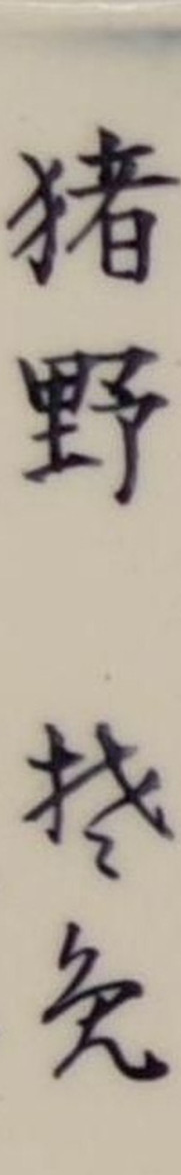猪野そめ
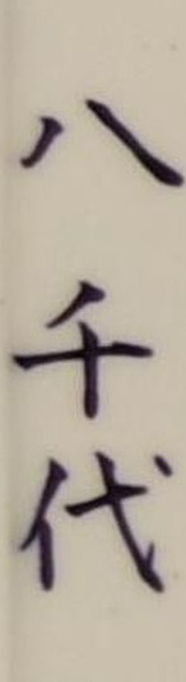八千代

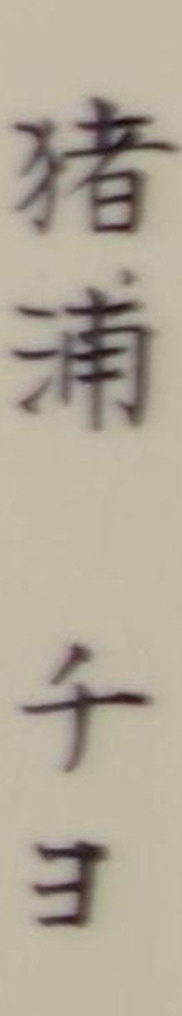猪浦チヨ
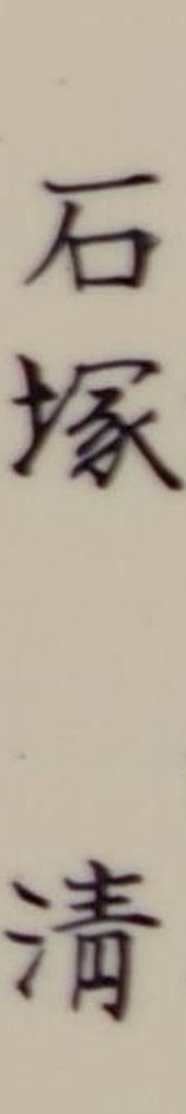石塚清
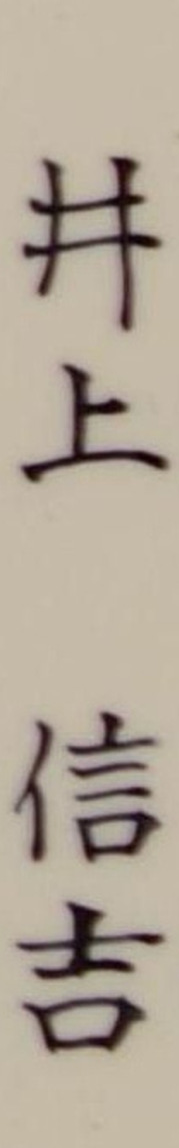井上信吉
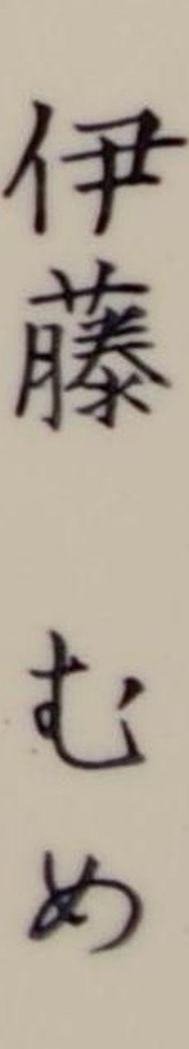伊藤むめ
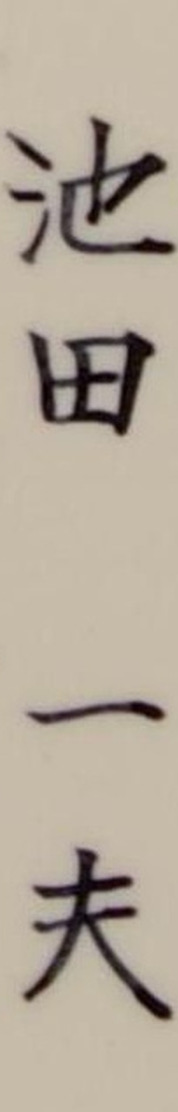池田一夫
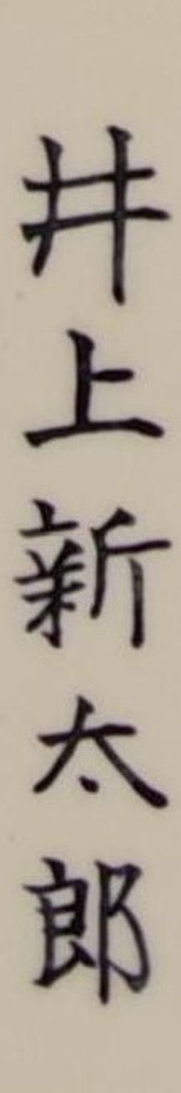井上新太郎
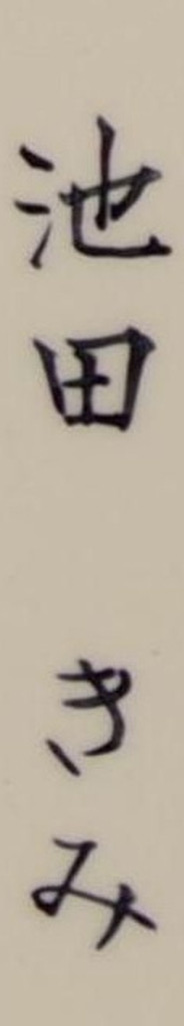池田きみ
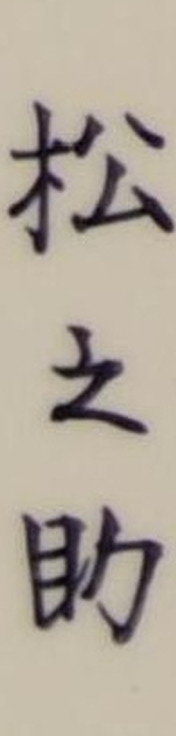松之助

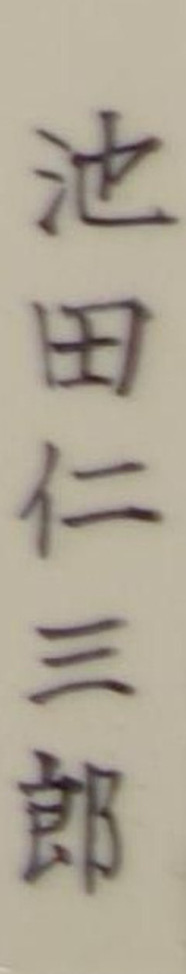池田仁三郎
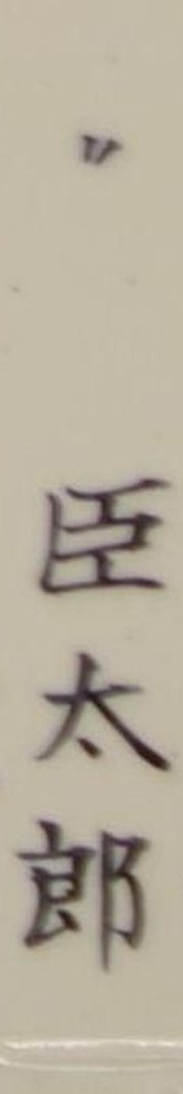臣太郎
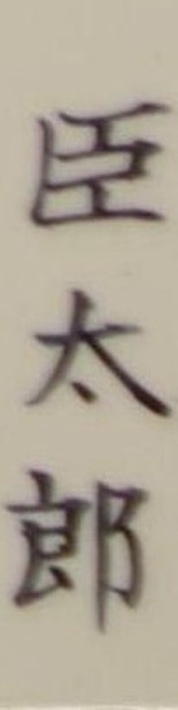臣太郎
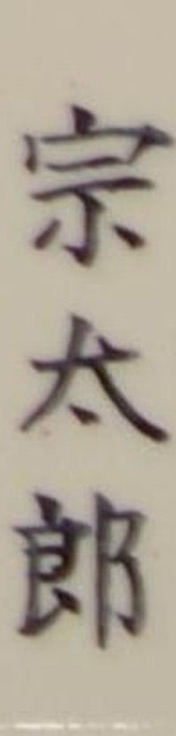宗太郎
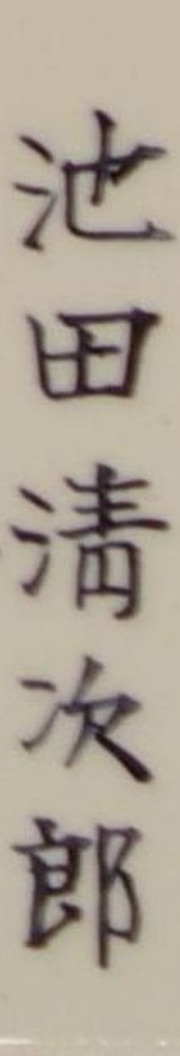池田清次郎
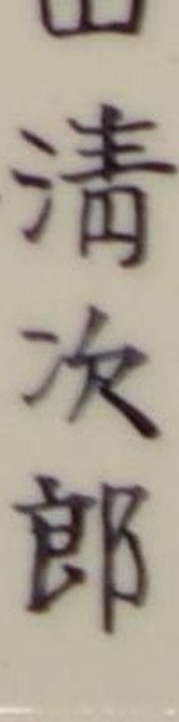唯次郎
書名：M~S
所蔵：高野山金剛峯寺
